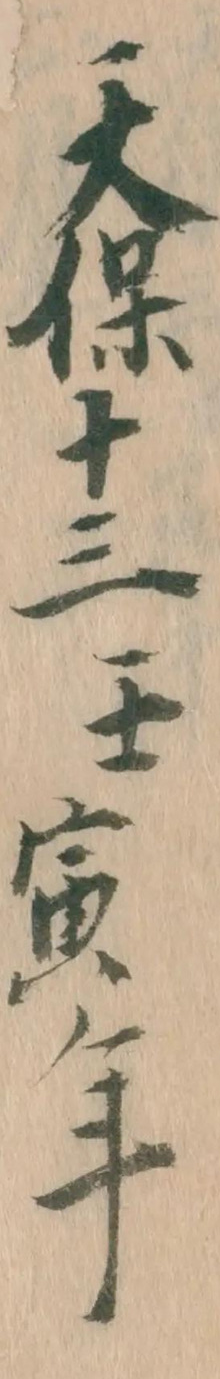天保十三壬寅年
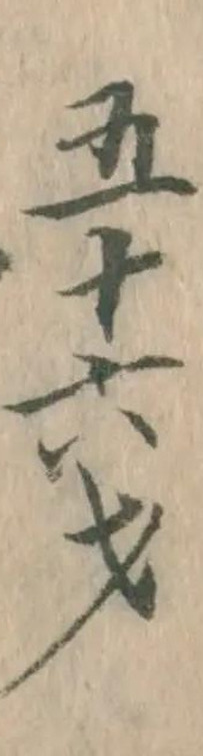五十六才

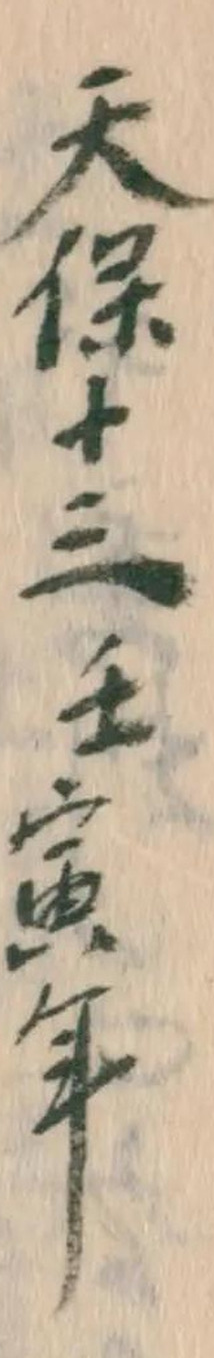天保十三壬寅年
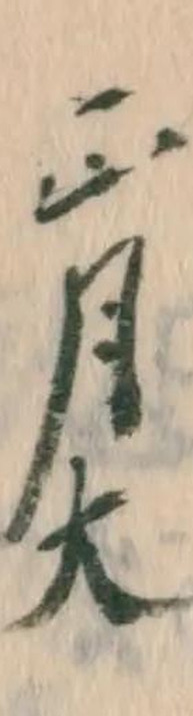正月大
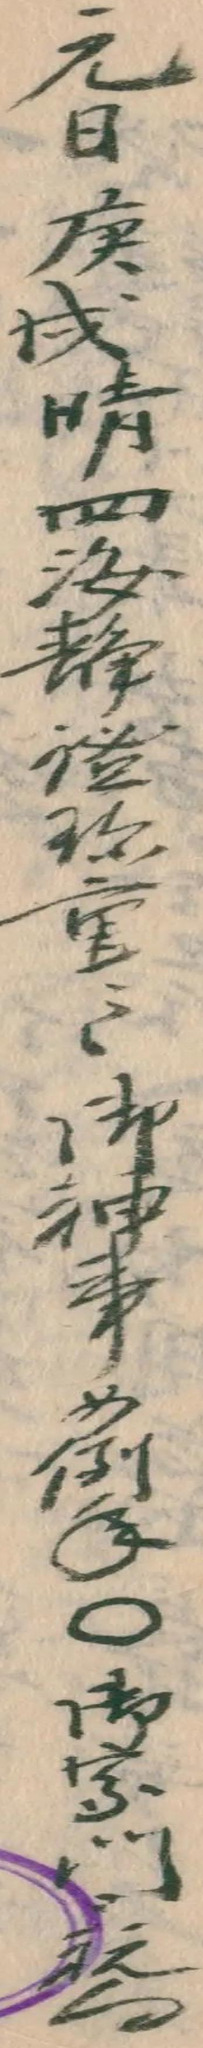元日庚戌晴四海静謐珍重云々御神事如例年○御家門祝向
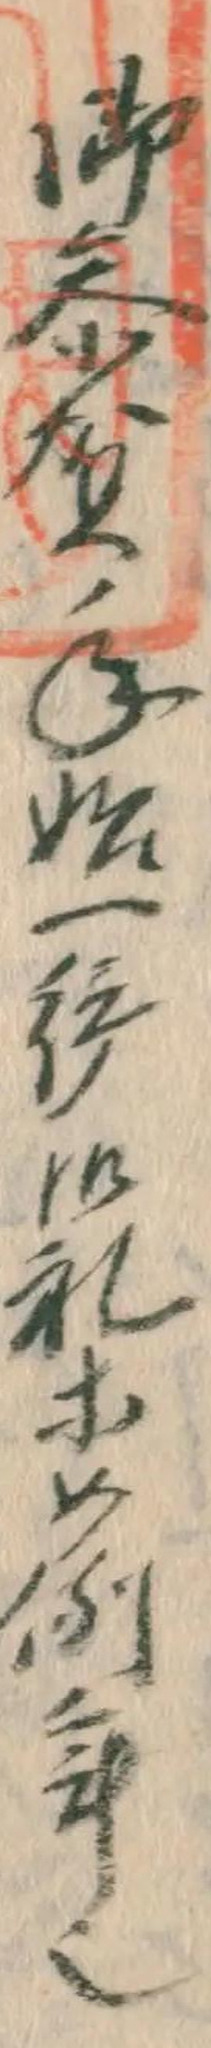御参貧年始一拝御礼等如例年也
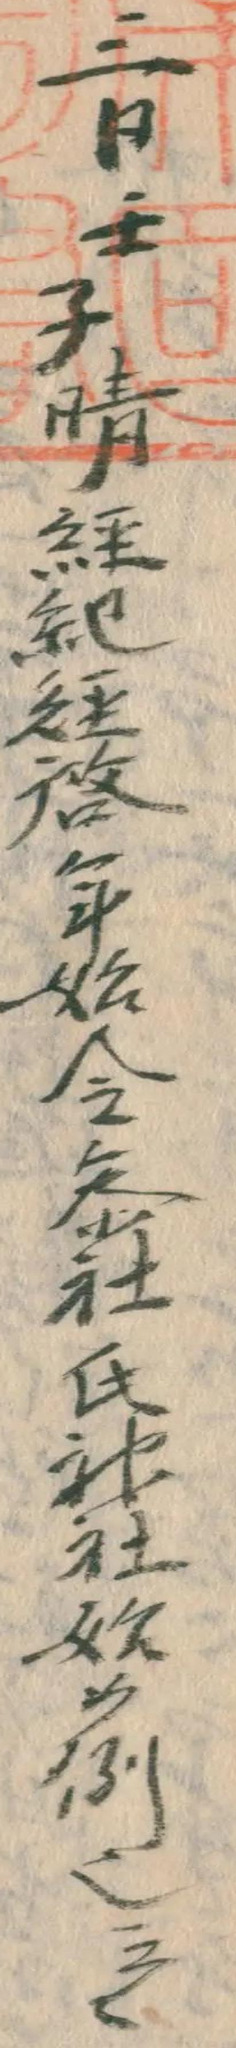三日壬子晴経紀経啓年始令参社氏神社始如例也云々
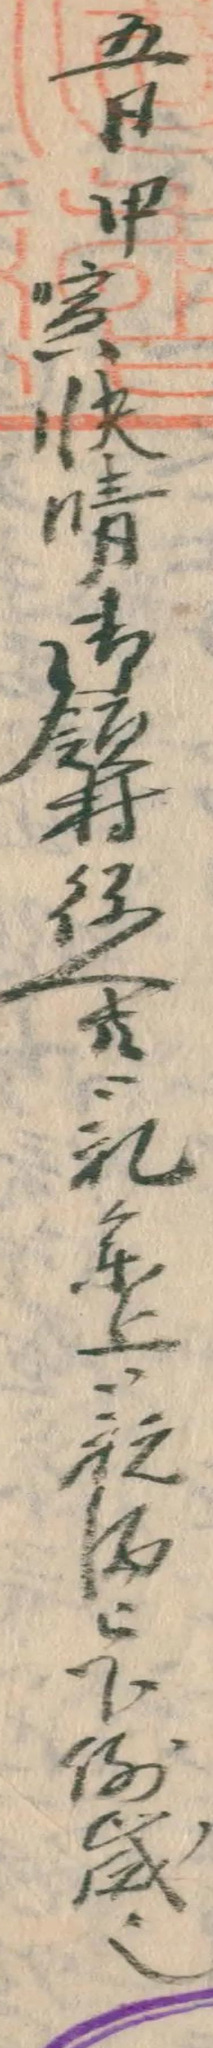五日甲寅快晴御領村役人共御礼参上御祝酒被下例歳也
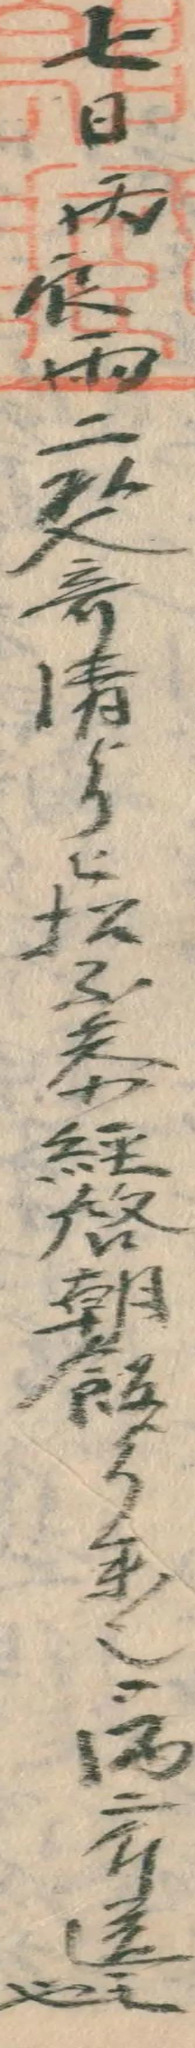七日丙辰雨二頭人奇清より被招不参経啓朝飯より参也御酒二升送之也
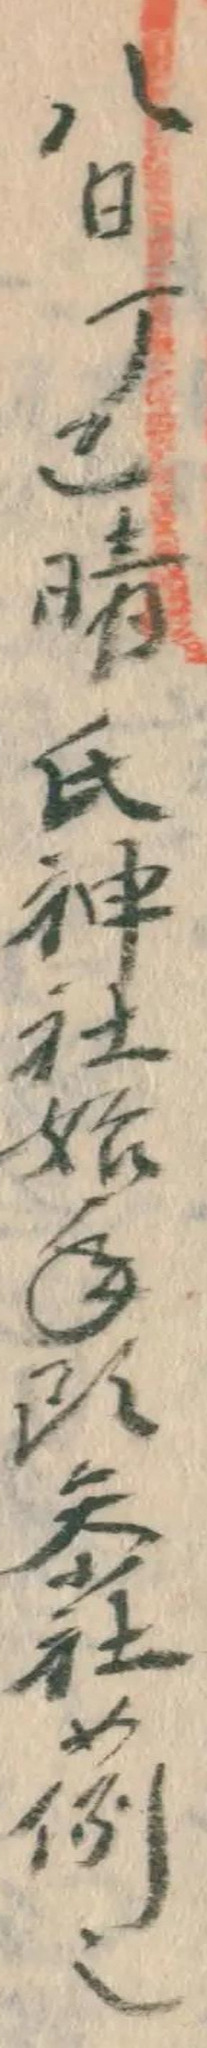八日丁巳晴氏神社始年頭参社如例也
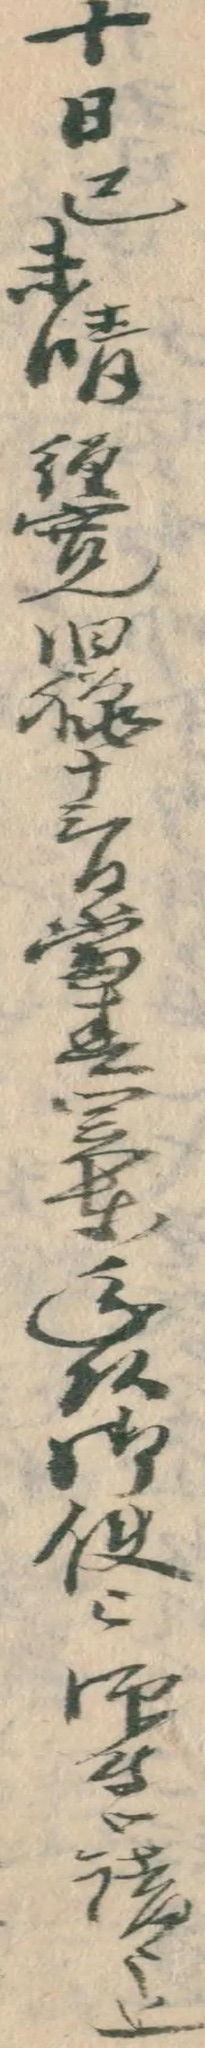十日巳未晴経寛旧臘十三日當春関東年頭御役被仰付御請申上
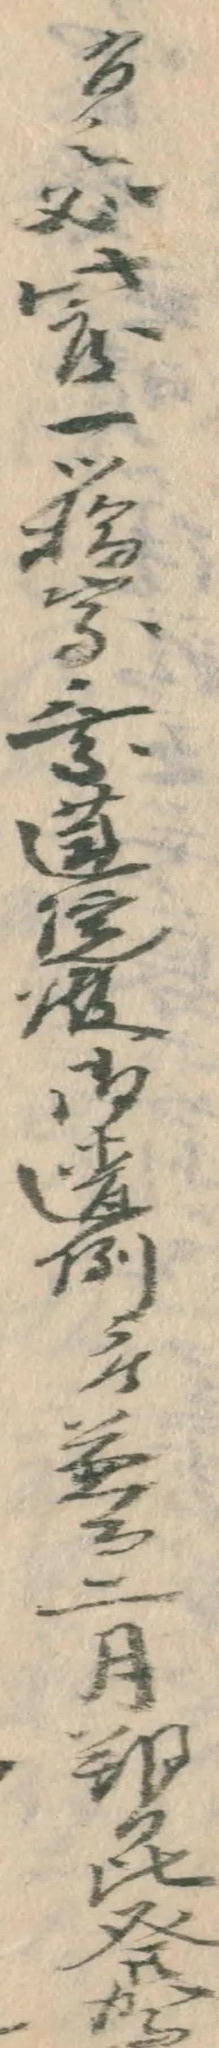有之処此度一ツ橋家乗蓮院殿御遺例ニ付兼而二月朔日比登駕
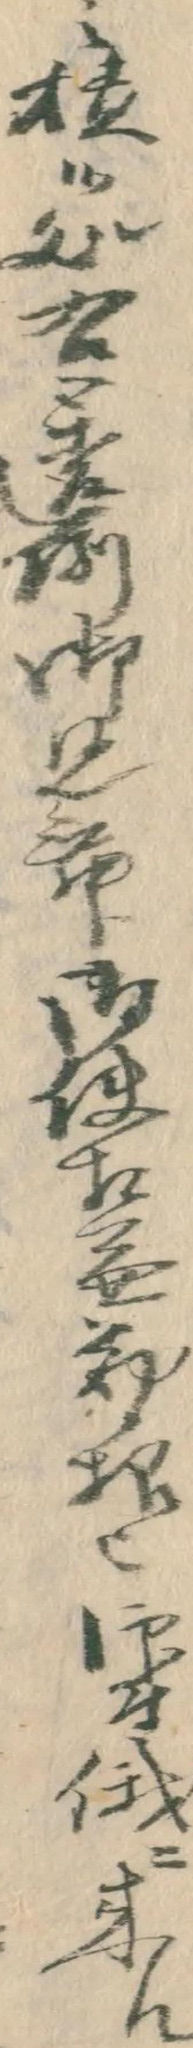之積候処右御違例御見舞御使相兼勤候様被仰付俄に来ル
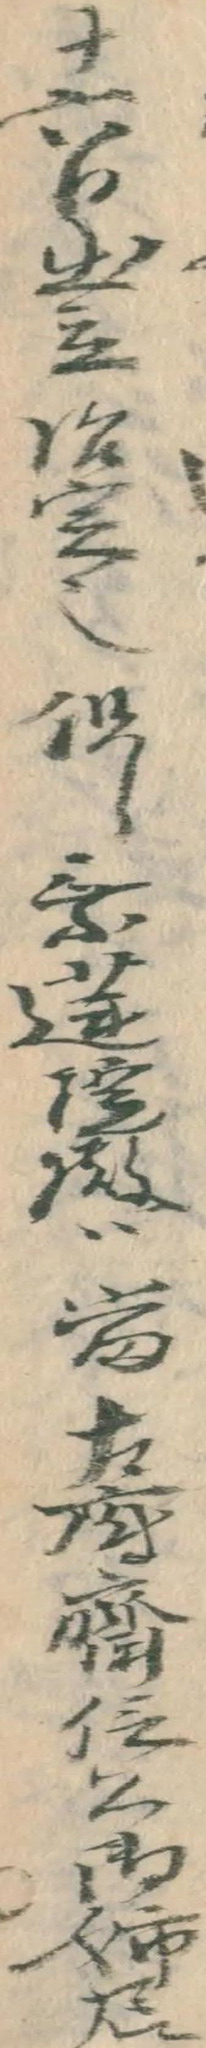十六日出立治定也但し乗蓮院殿ハ當左府齋信公御姉君

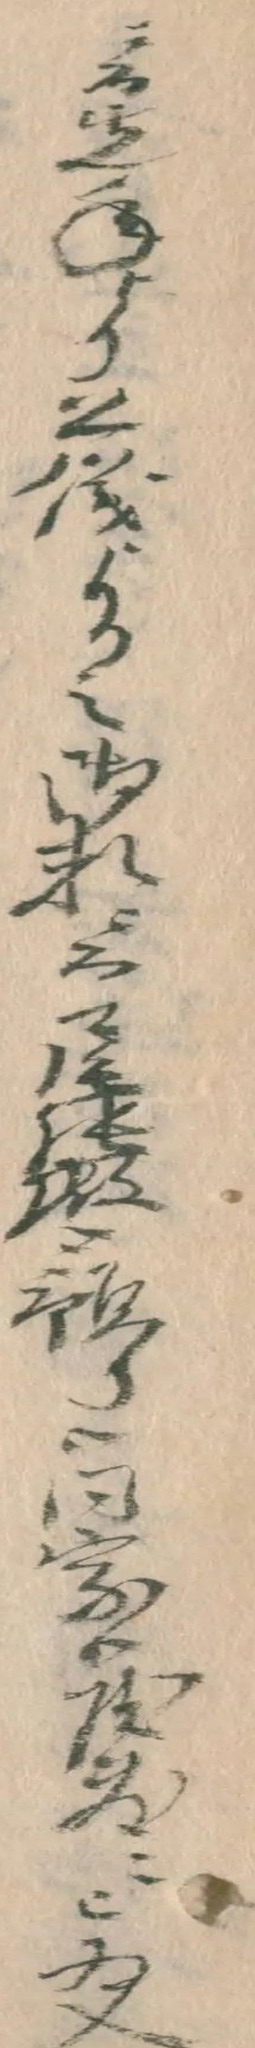ニ而先年より公儀より之御頼ニ而尾張殿御預り御同家ゟ屋敷ニ被為入
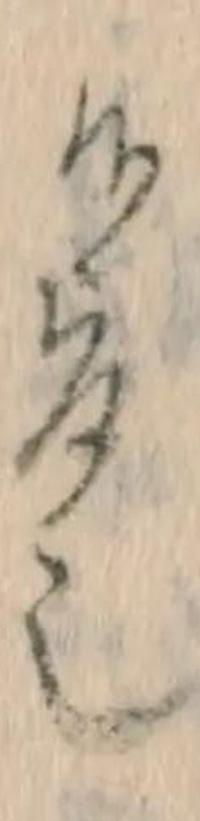候旨也
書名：賀茂社記録. 第69冊
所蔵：国立国会図書館 National Diet Library, JAPAN
